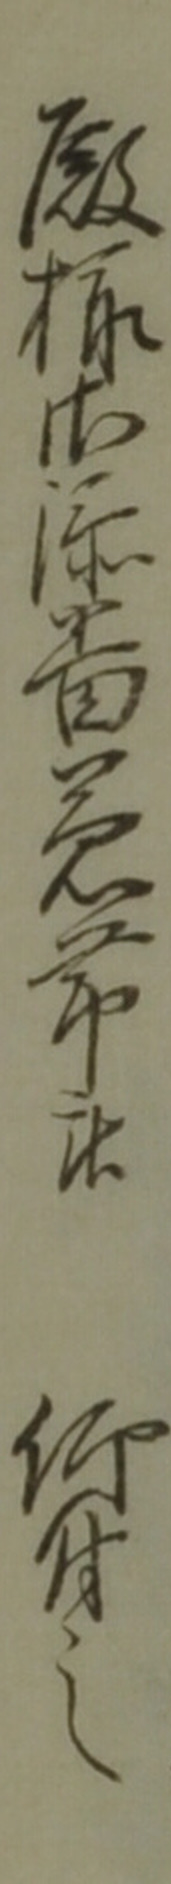殿様御添番兼帯被仰付之
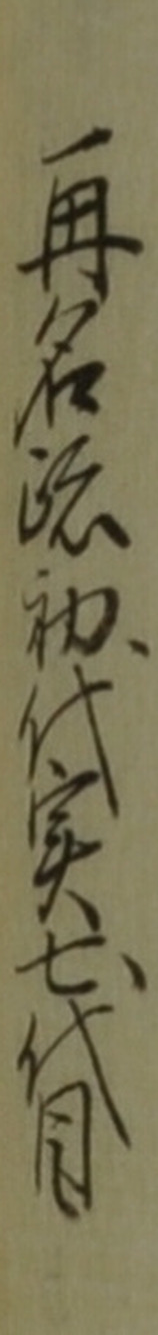再名跡初代実七代目
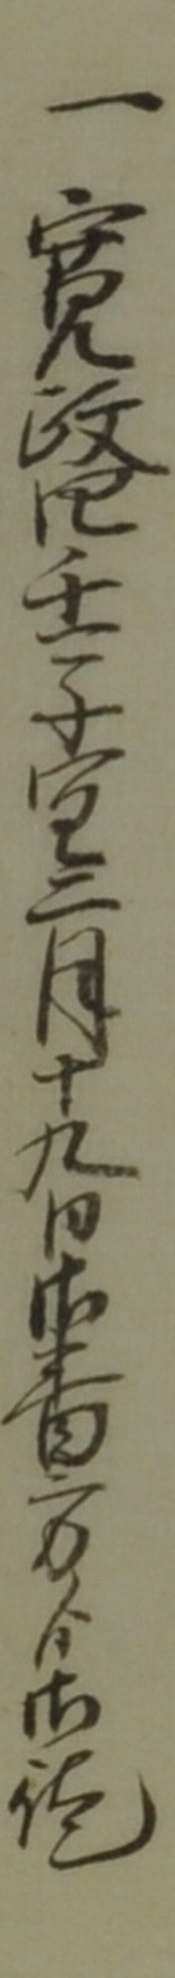一寛政四壬子閏二月十九日御番方ゟ御徒
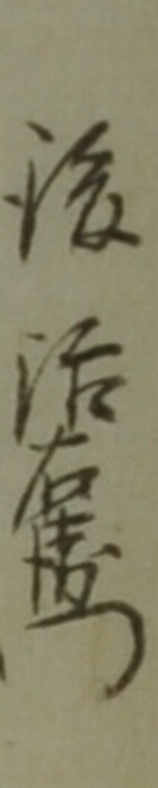後治右衛門
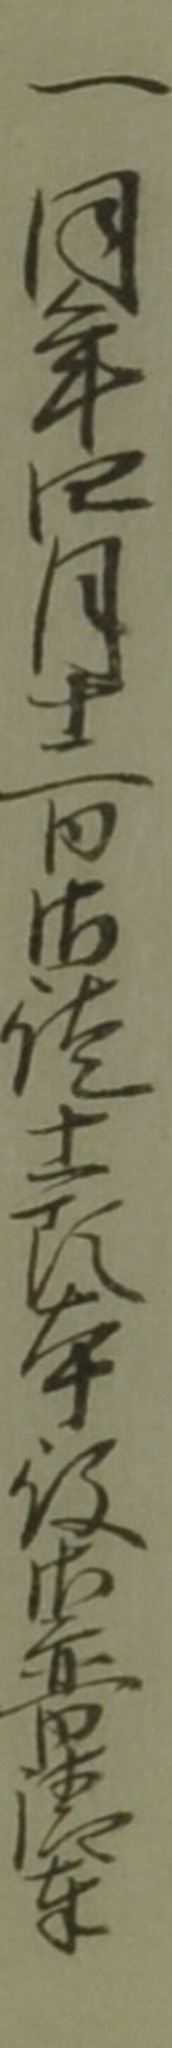一同年四月十二日御徒士頭本役御普請奉
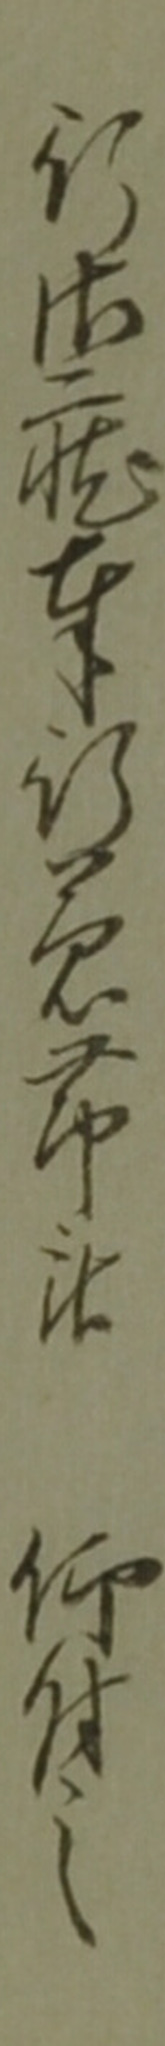行御蔵奉行兼帯被仰付之
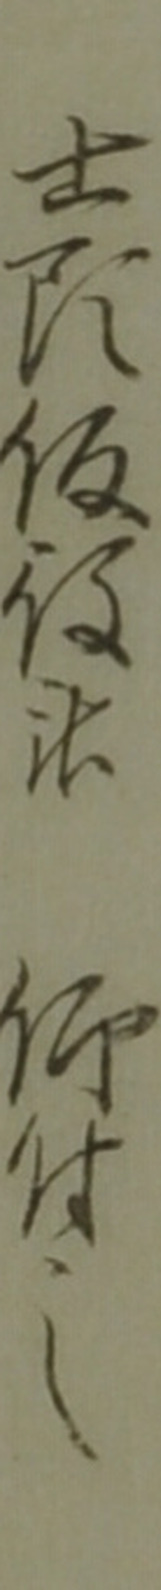士頭仮役被仰付之
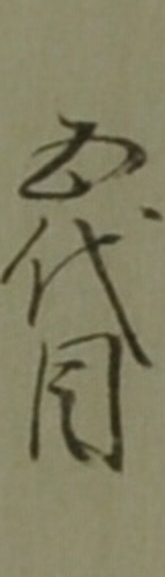五代目
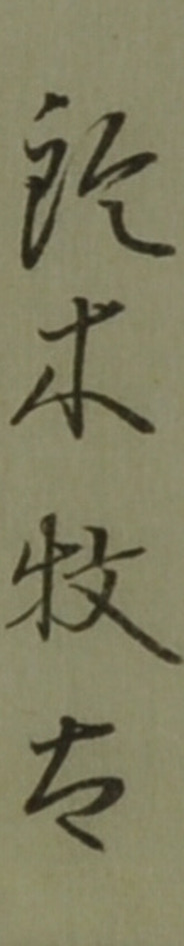鈴木牧太
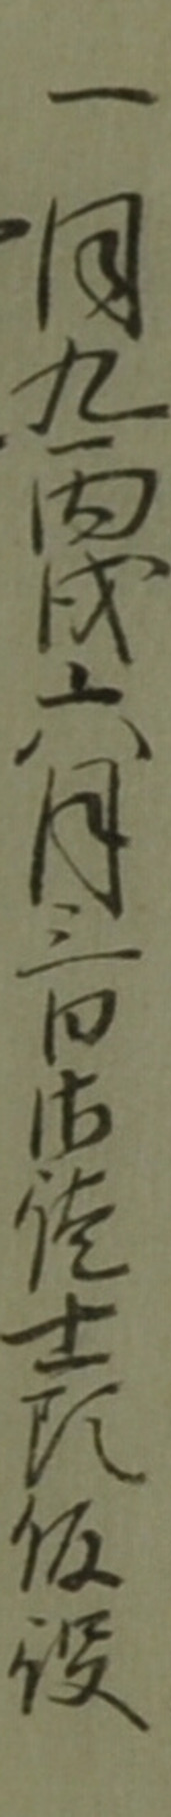一同九丙戌六月三日御徒士頭仮役
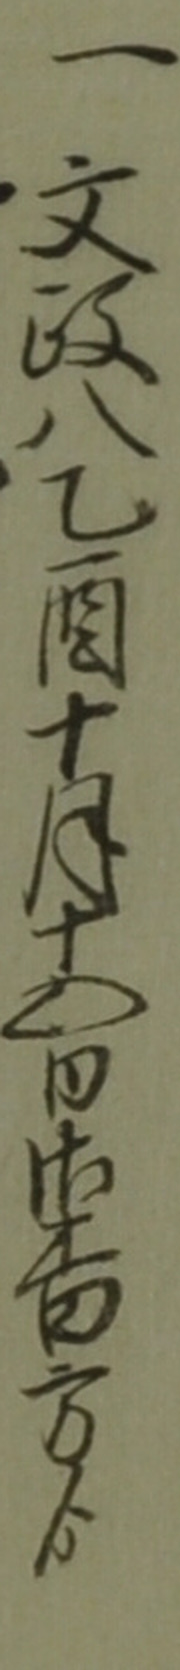一文政八乙酉十月十五日御番方ゟ
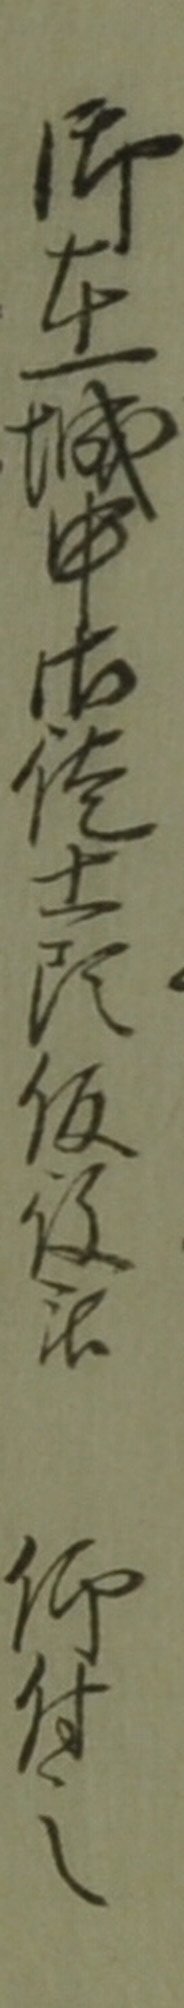御在城中御徒士頭仮役被仰付之
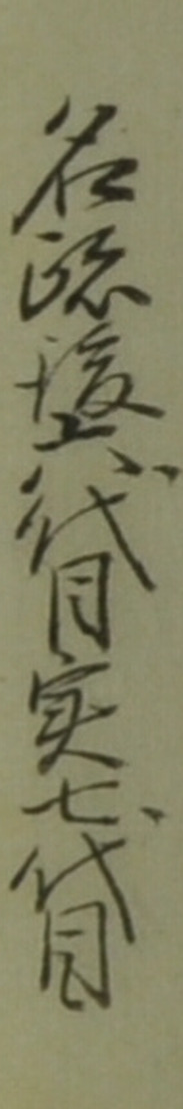名跡後六代目実七代目

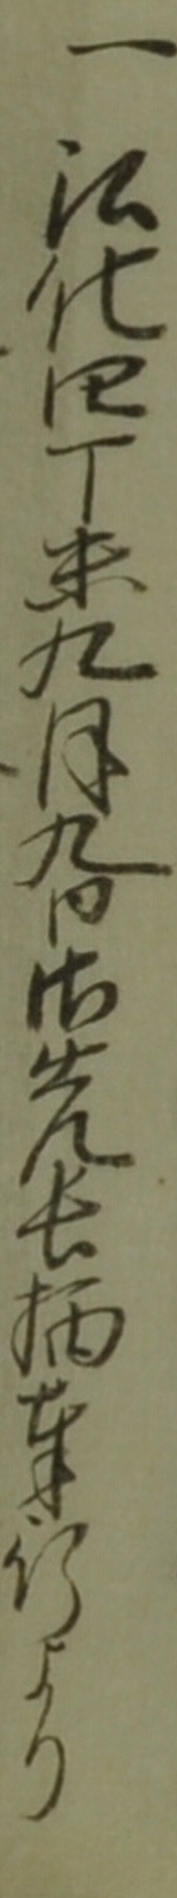一弘化四丁未九月九日御先長柄奉行より
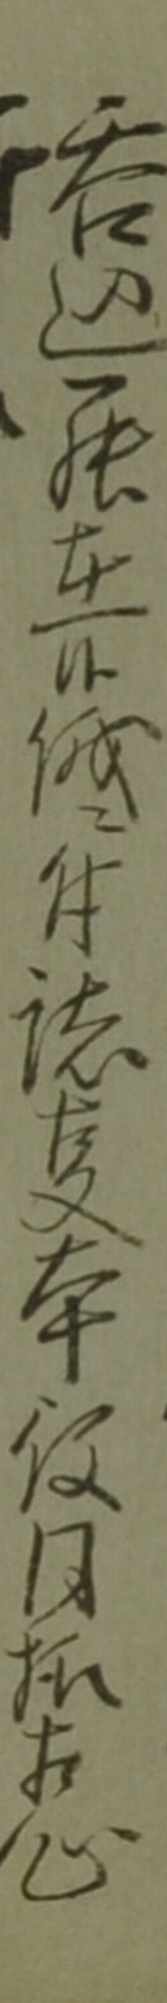呑込罷在候俄ニ付諸事本役同格相心
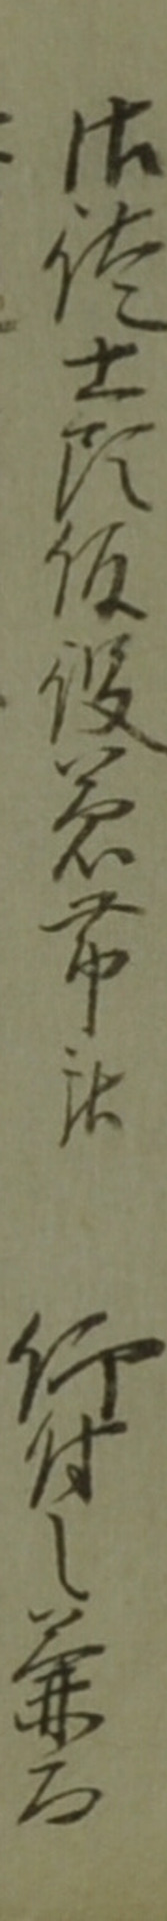御徒士頭仮役兼帯被仰付之兼而
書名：諸御役代々録（六）
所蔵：伊那市立高遠町図書館・合同会社AMANE
